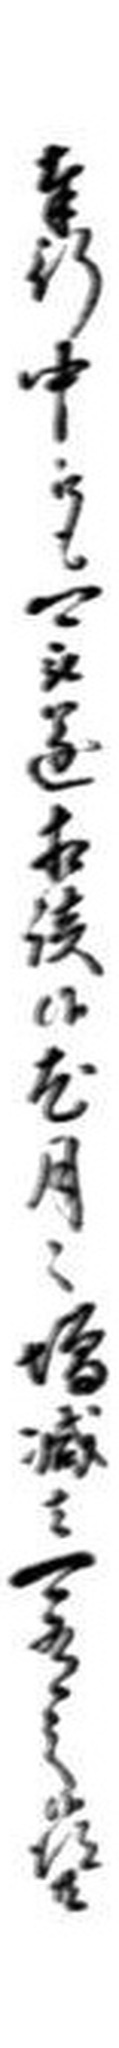奉行中江も可被遂相談候尤月々増減者可有之候得共
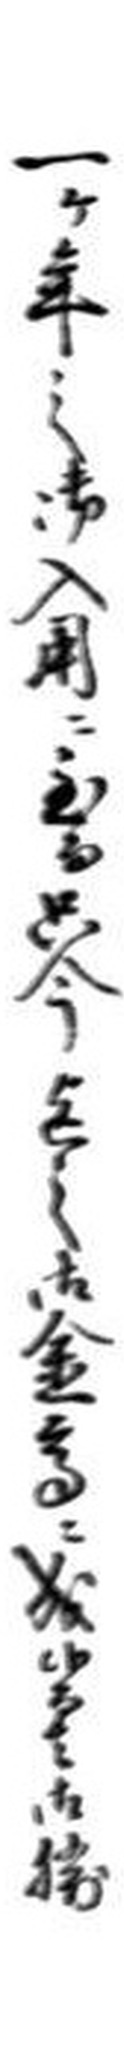一ヶ年之御入用ニ至而只今迄之御金高ニ成候而者御勝
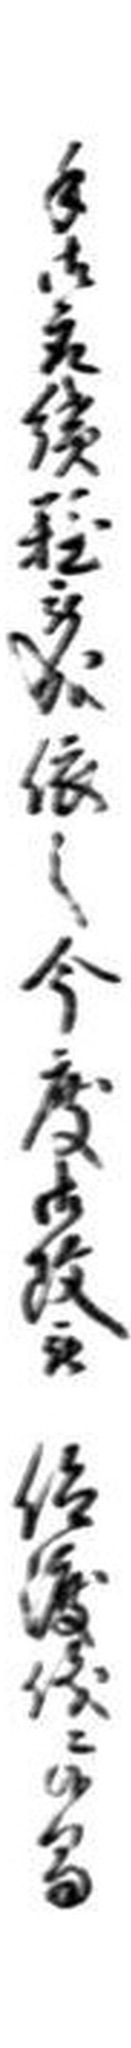手御取続難被成依之今度御改被仰渡儀ニ候間
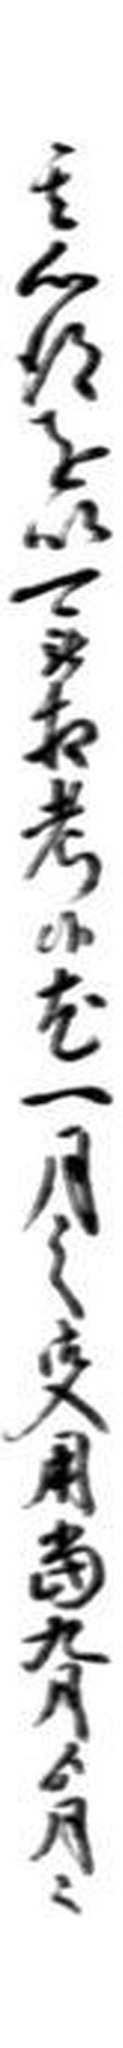其心得を以可被相考候尤一月之御入用当九月ゟ月々
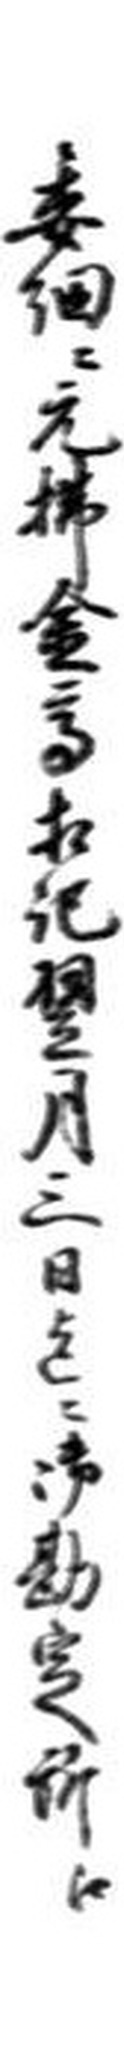委細ニ元払金高相記翌月三日迄ニ御勘定所江
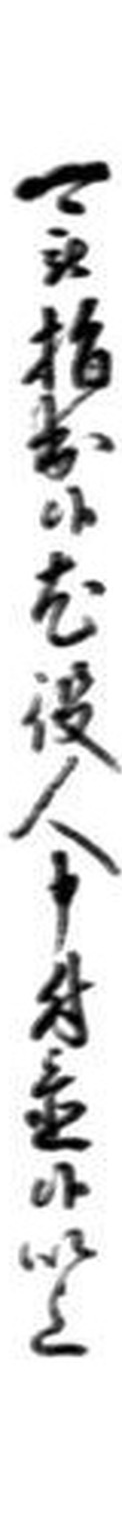可被指出候尤役人申付置候以上
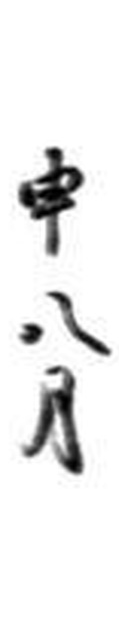申八月
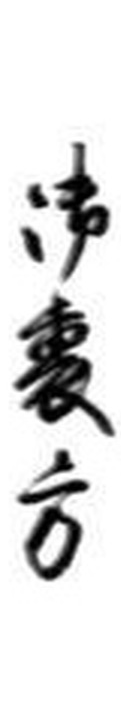御裏方

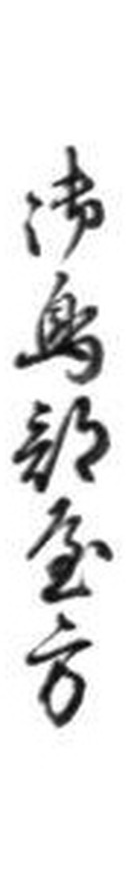御鳥部屋方
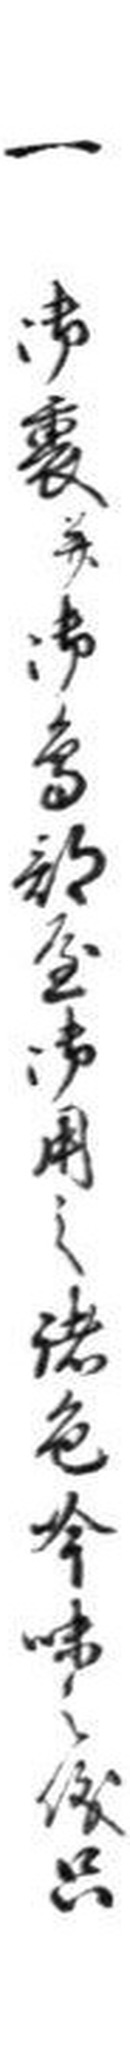一御裏并御鳥部屋御用之諸色吟味之儀只
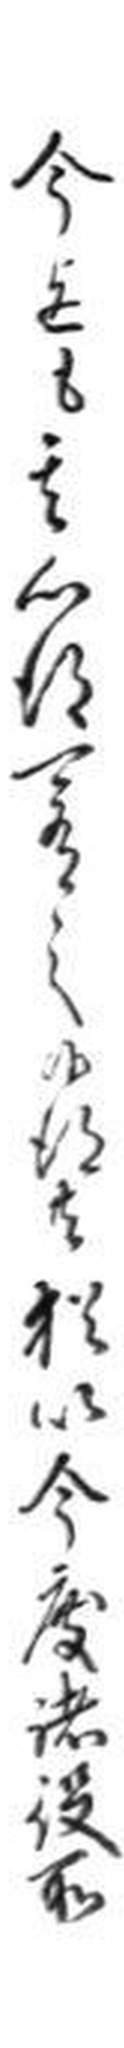今迄も其心得可有之候得共猶以今度諸役所
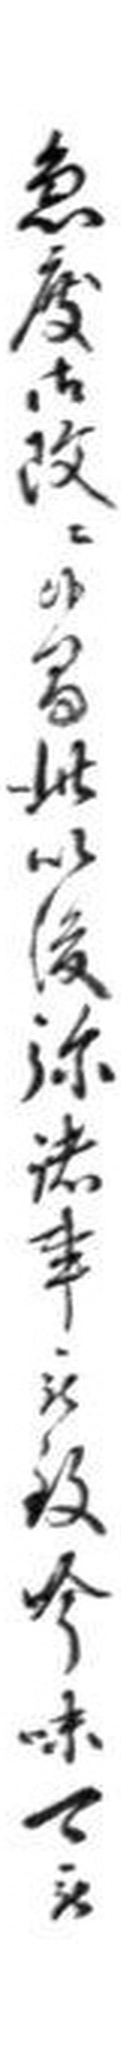急度御改ニ候間此以後弥諸事被致吟味可被
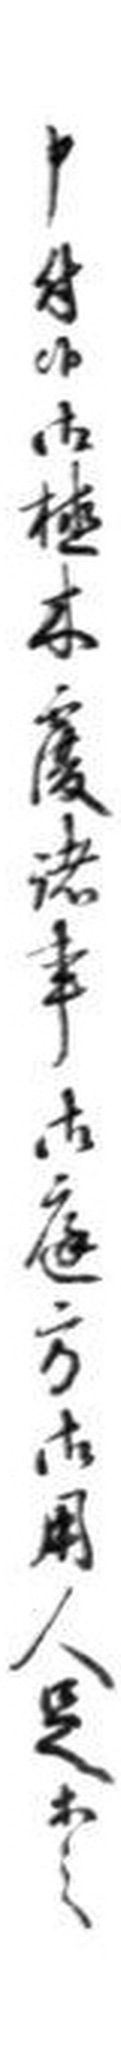申付候御植木覆諸事御庭方御用人足等之
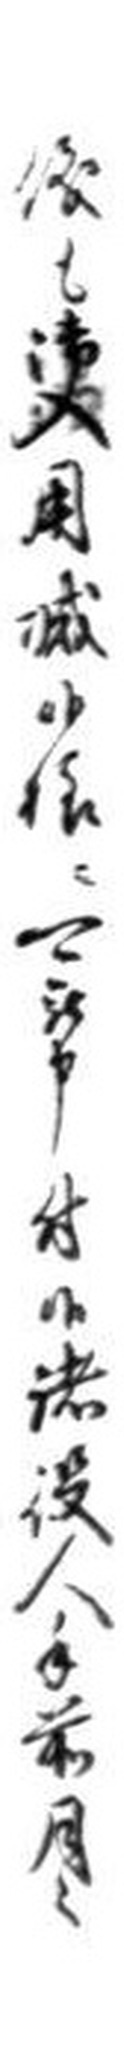儀も御入用減候様ニ可被申付候諸役人手前月々
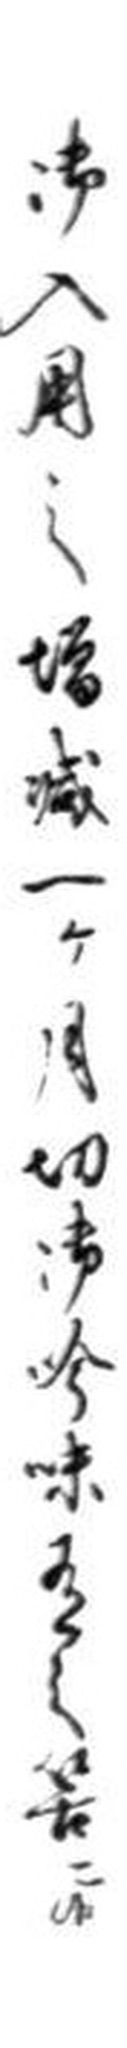御入用之増減一ヶ月切御吟味有之筈ニ候
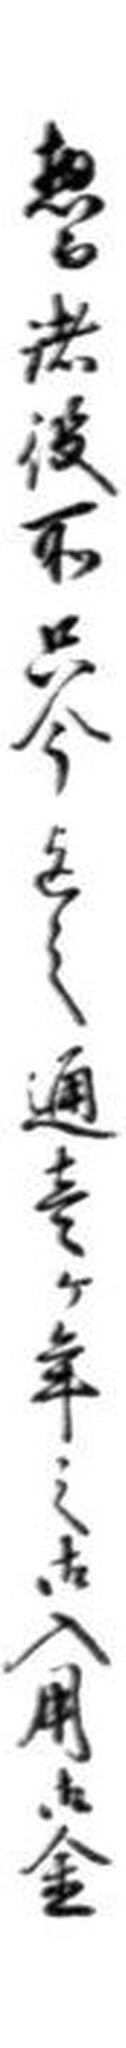惣而諸役所只今迄之通壱ヶ年之御入用御金
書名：家譜 三十一 吉邦公 享保元年
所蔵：福井県文書館 Fukui Prefectural Archives
